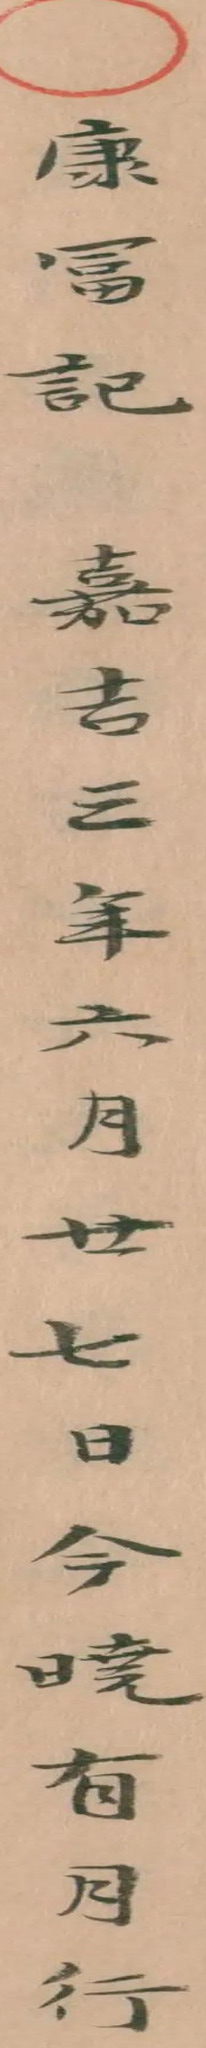○康富記嘉𠮷三年六月廿七日今暁有月行
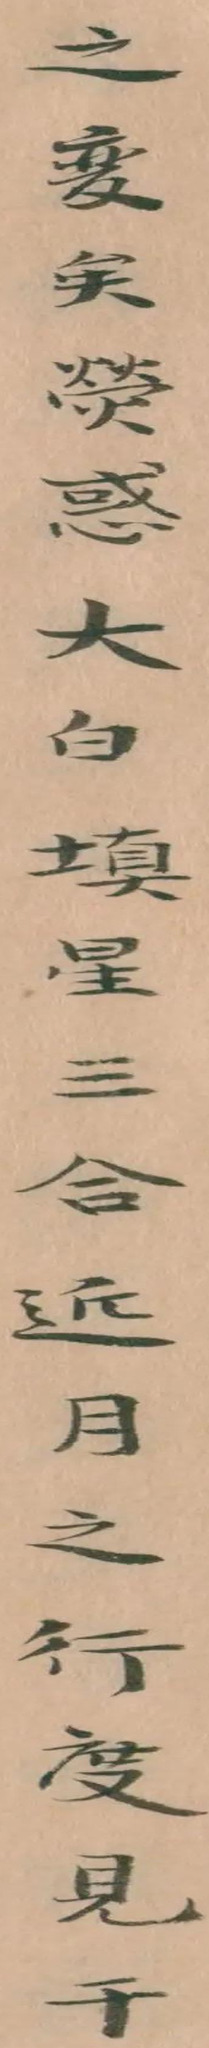之変矣熒惑大白填星三合近月之行度見于
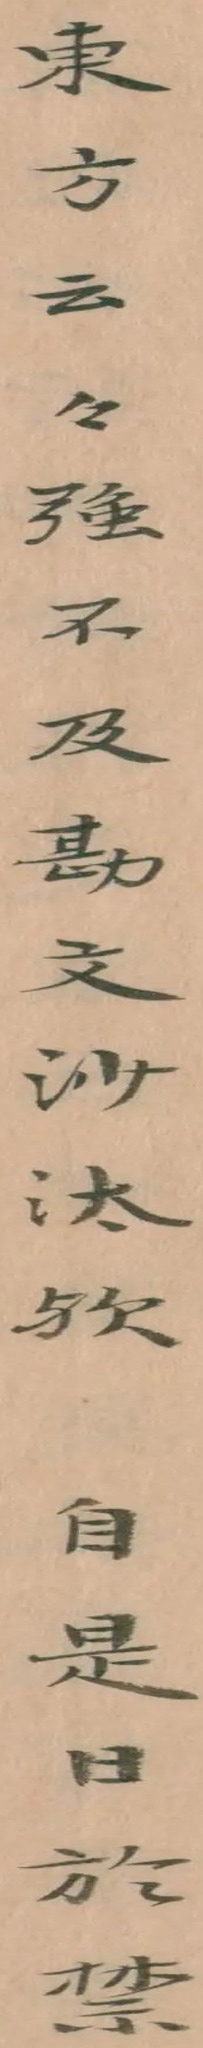東方云々強不及勘文沙汰歟自是日於禁

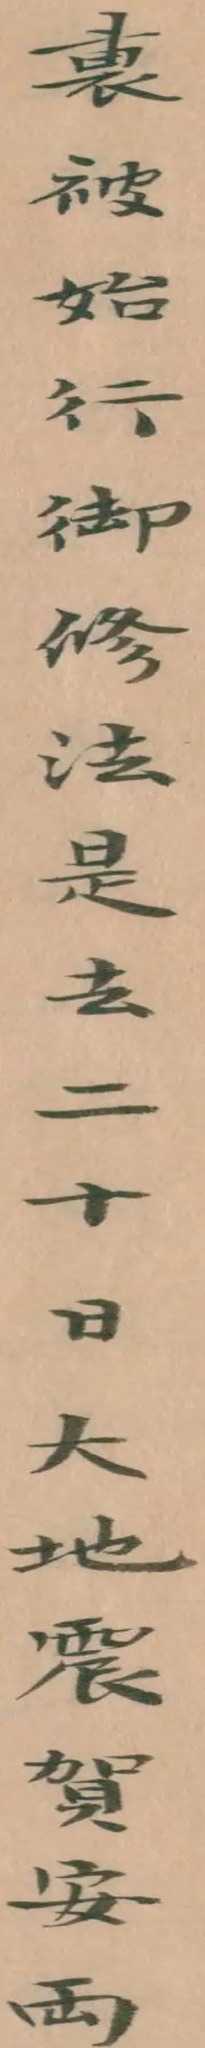裏被始行御修法是去二十日大地震賀安両
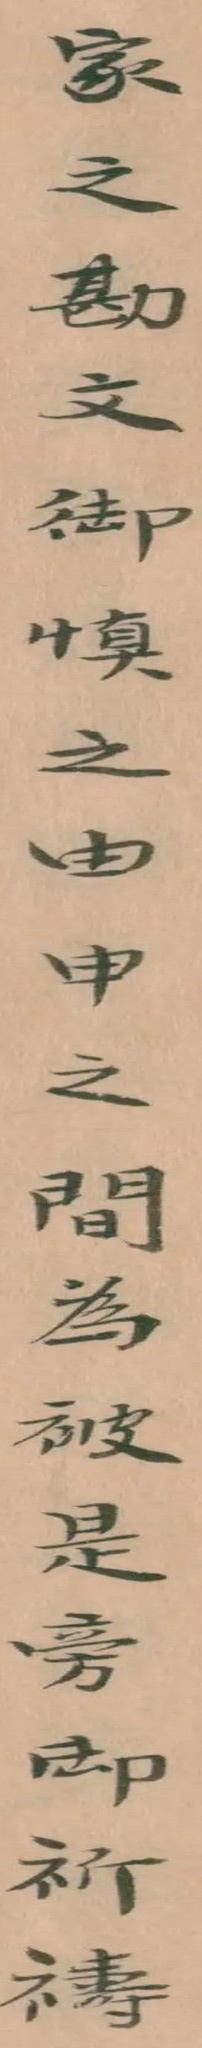家之勘文御慎之由申之間為被是旁御祈祷
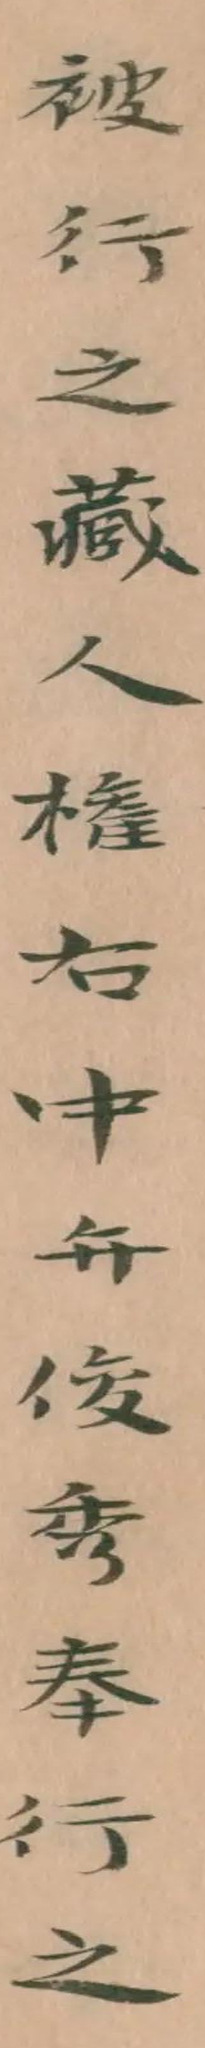被行之蔵人権右中弁俊秀奉行之
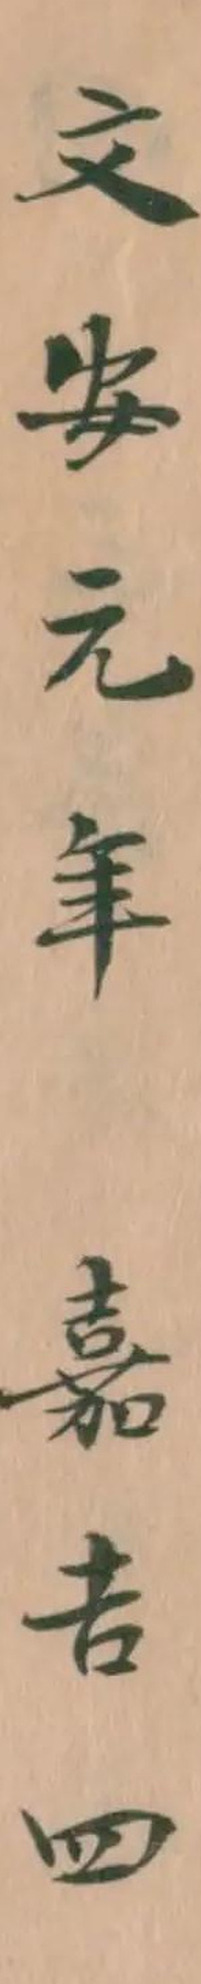文安元年嘉𠮷四
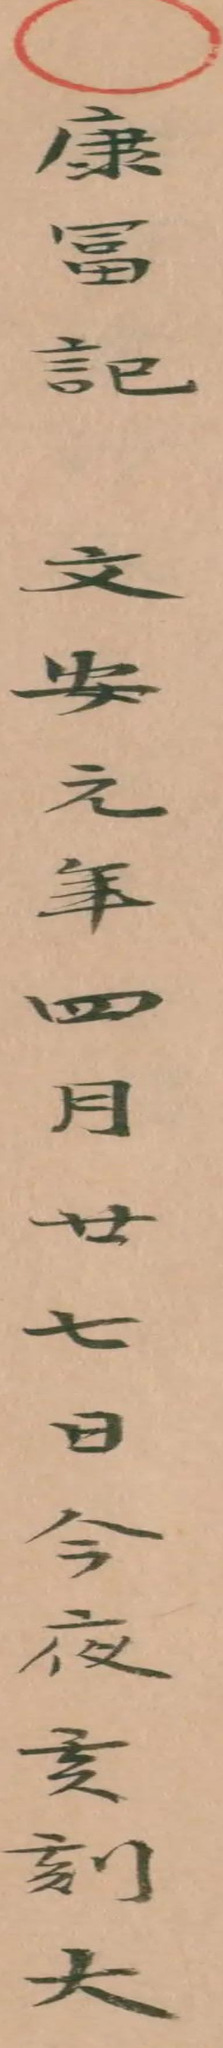○康富記文安元年四月廿七日今夜亥刻大
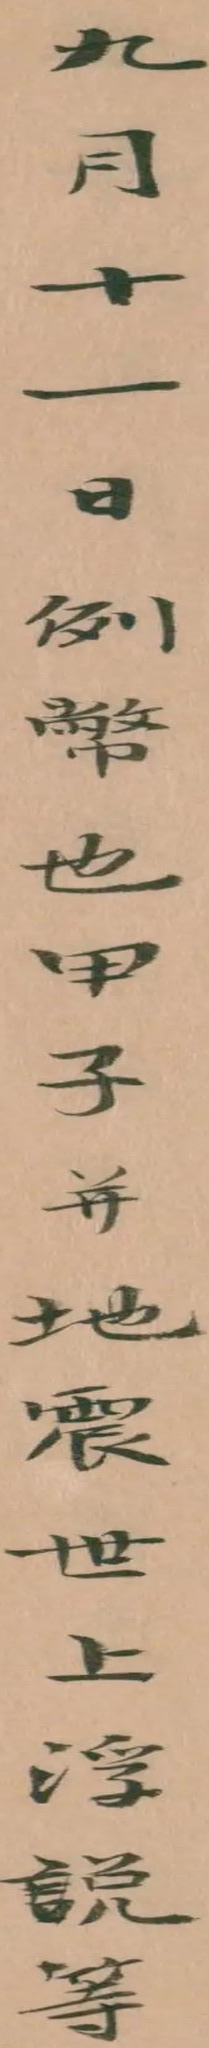九月十一日例幣也甲子幷地震世上浮説等
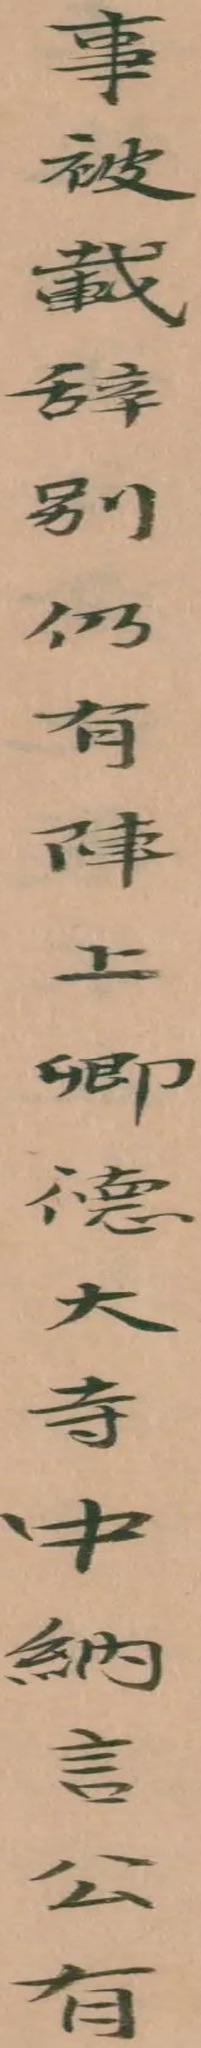事被戴辞別仍有陣上卿徳大寺中納言公有
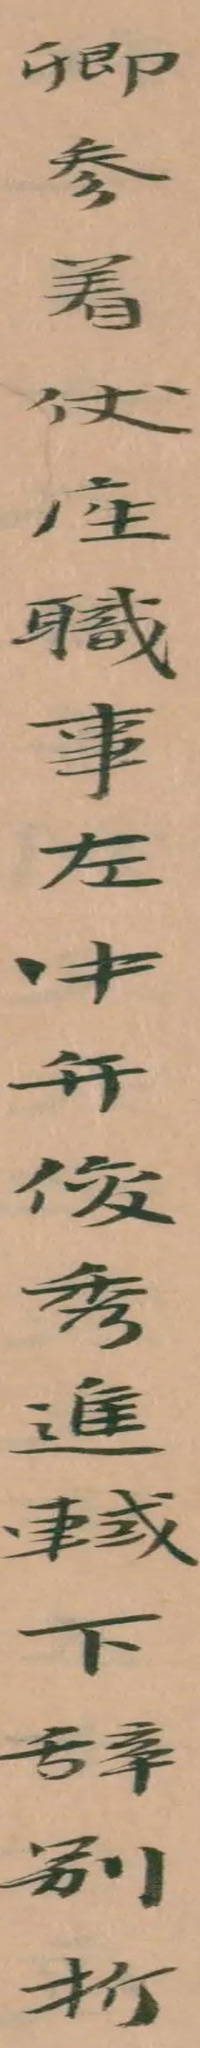卿参着伏座職事左中弁俊秀進下辞別折
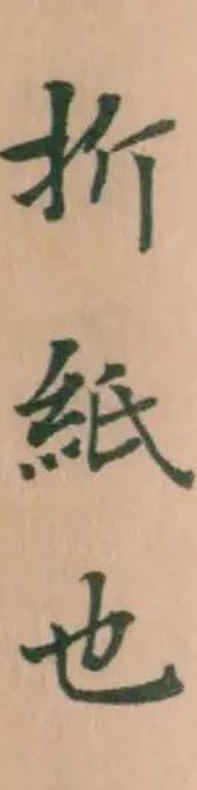折紙也
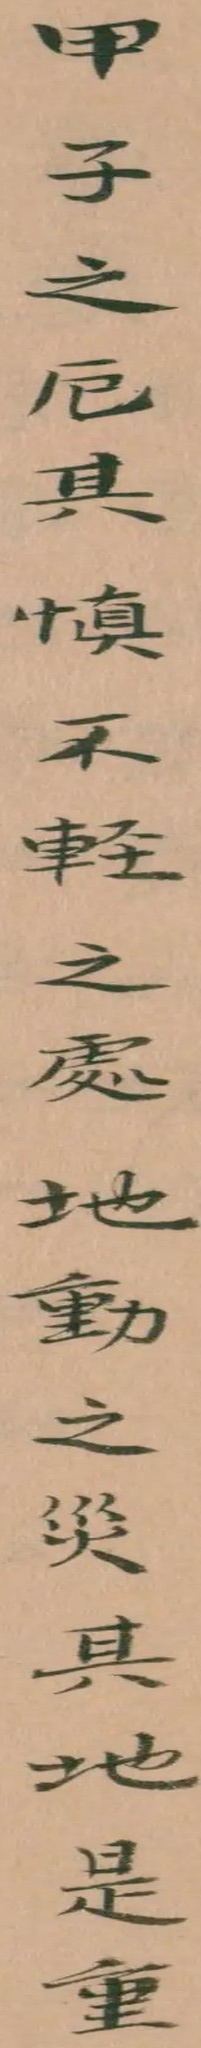甲子之厄其慎不軽之処地動之災其地是重
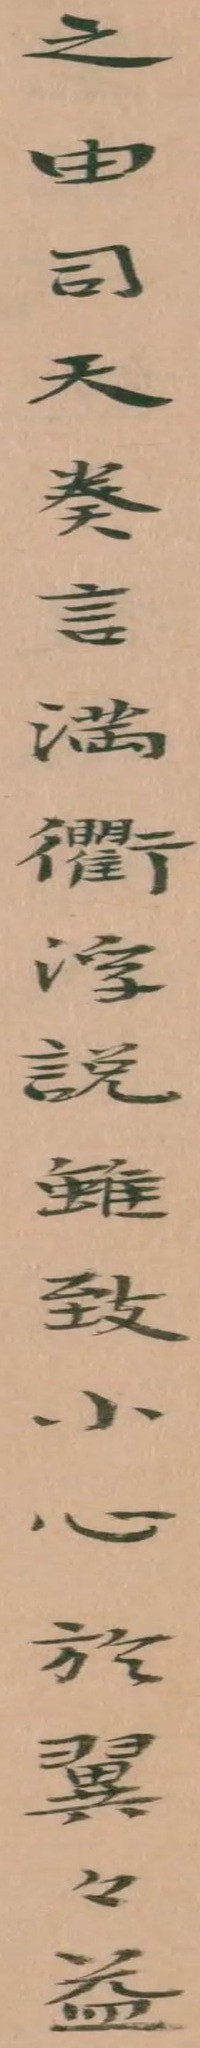之由司天奏言満衢浮説雖致小心於翼々益
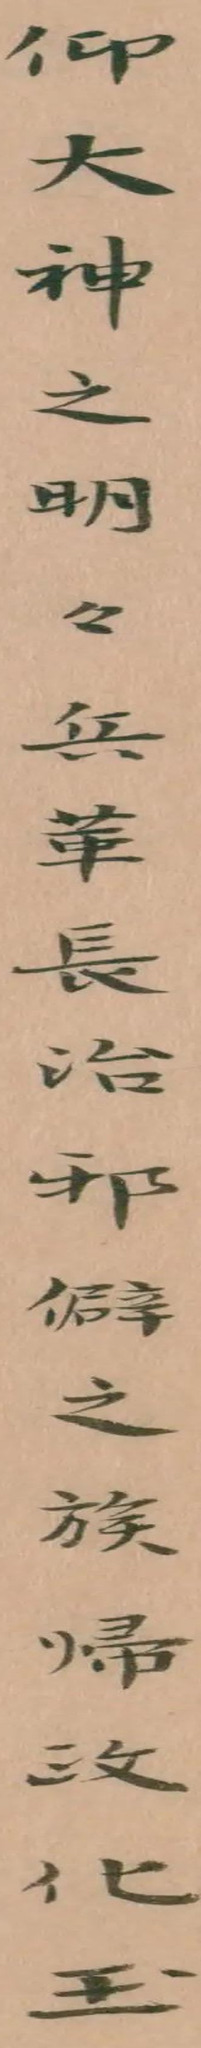仰大神之明々兵革長治邪僻之族帰政化玉
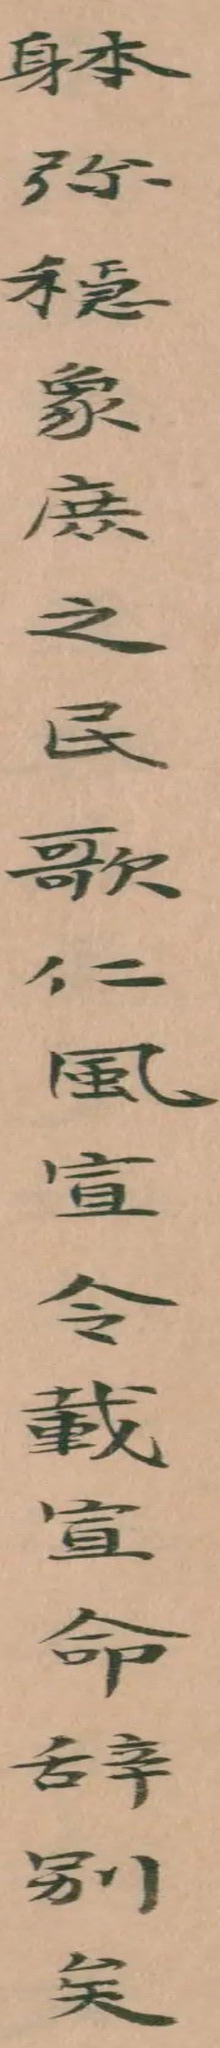体弥穏象庶之民歌仁風宜令戴宣命辞別矣
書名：地災撮要. 巻5-6(地震之部)
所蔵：国立国会図書館 National Diet Library, JAPAN
